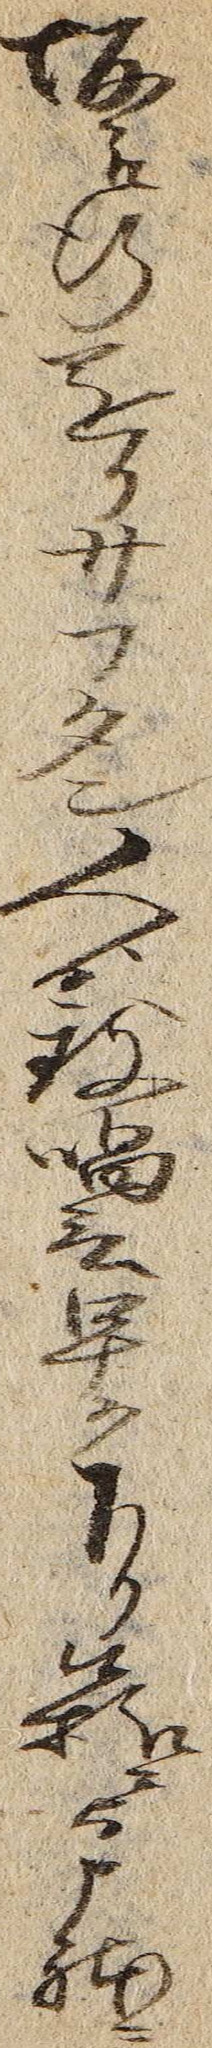坂へ行懸りサフタン人より致唱言早く下り候様にと申体に
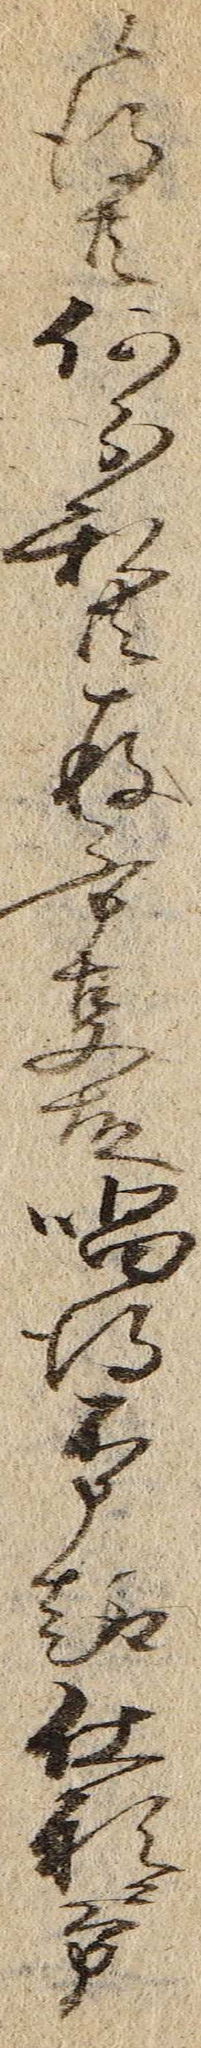候得ども何分私ども存不申事故唱得不申趣仕形にて申
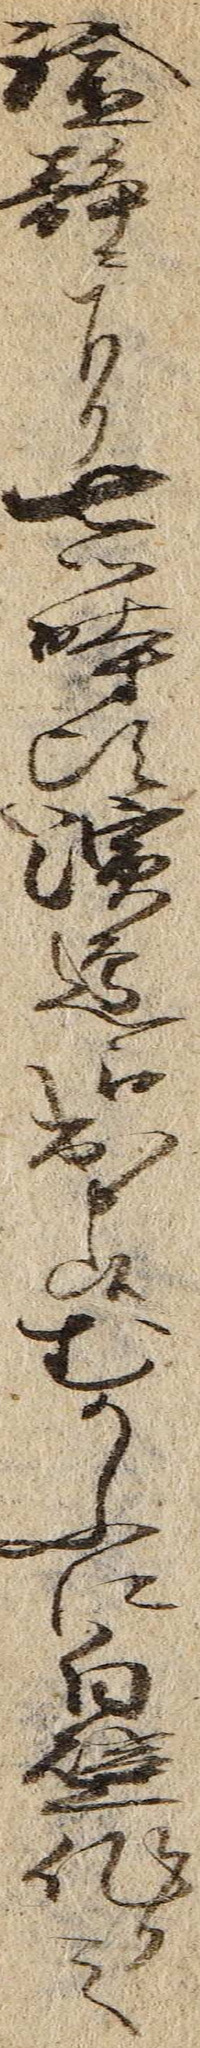詮静に下り七つ時頃浜辺へ出申候むかふに白壁作りの
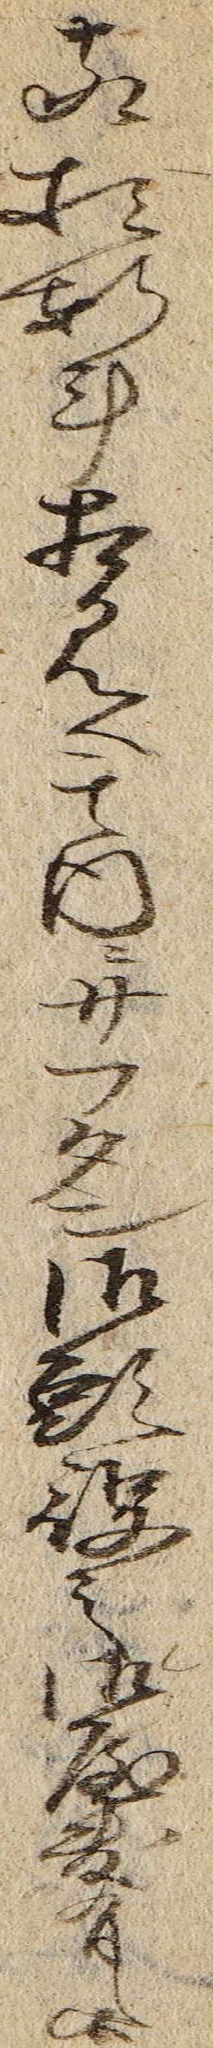家十軒斗相見へ其内にサフタン御頭役の御屋敷有之候
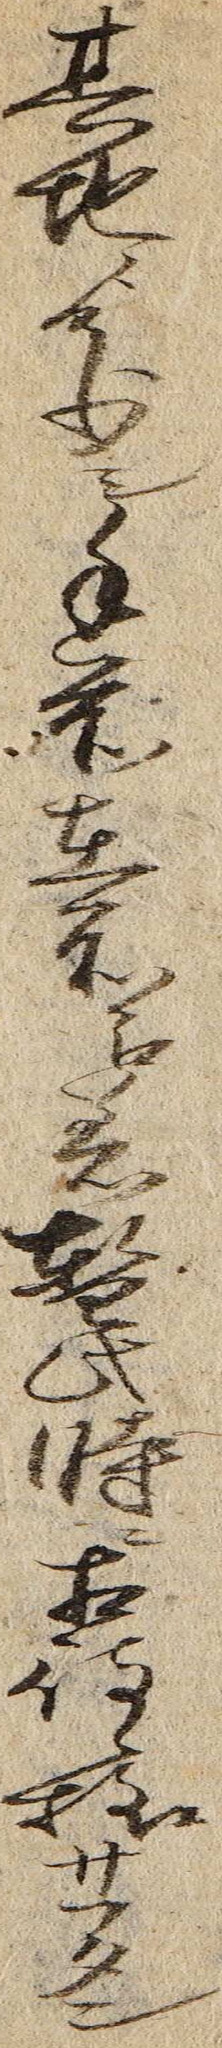其地より少し手前へ着暫此時に相待候様サフタン
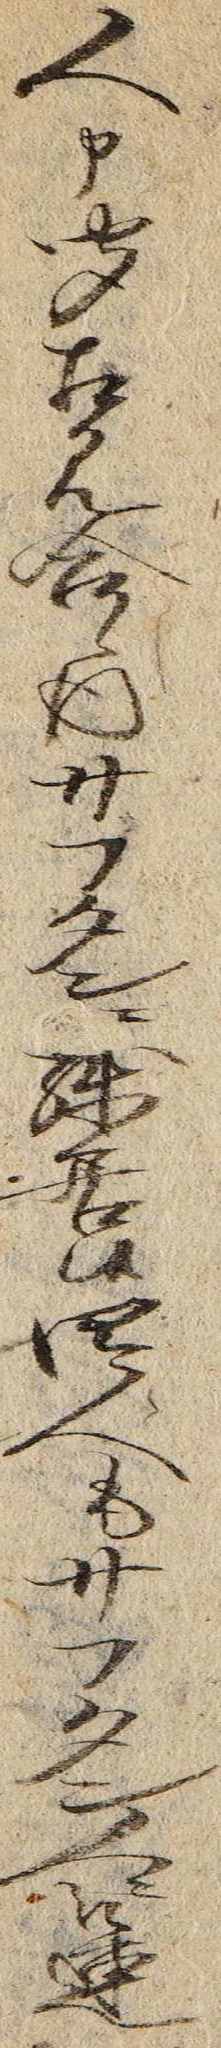人申聞相見合の内サフタンに残居候四人もサフタン人に被連
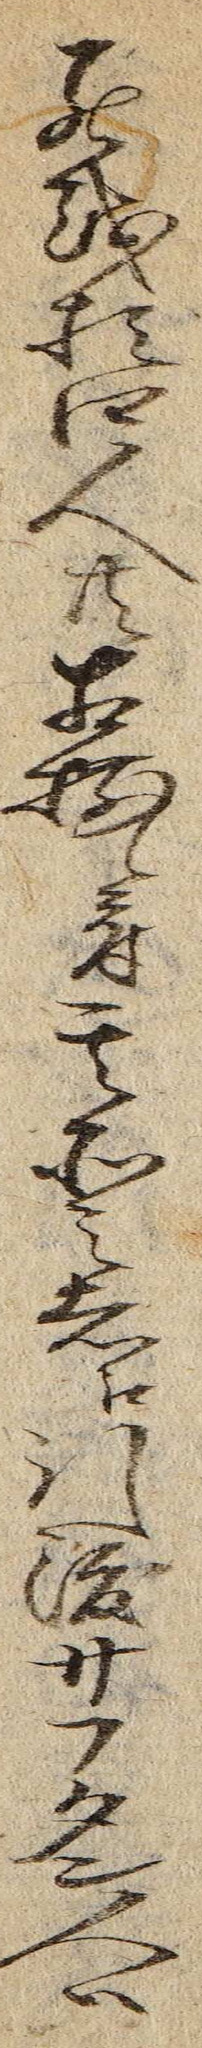罷越十四人とも相揃候に付其所の者へ引渡サフタン人は
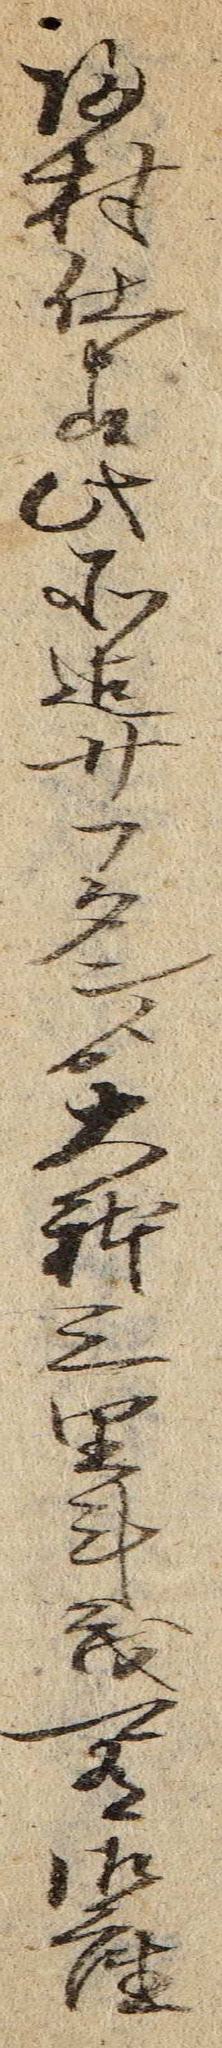帰村仕申候此所までサフタンより大体三里斗も可有御座

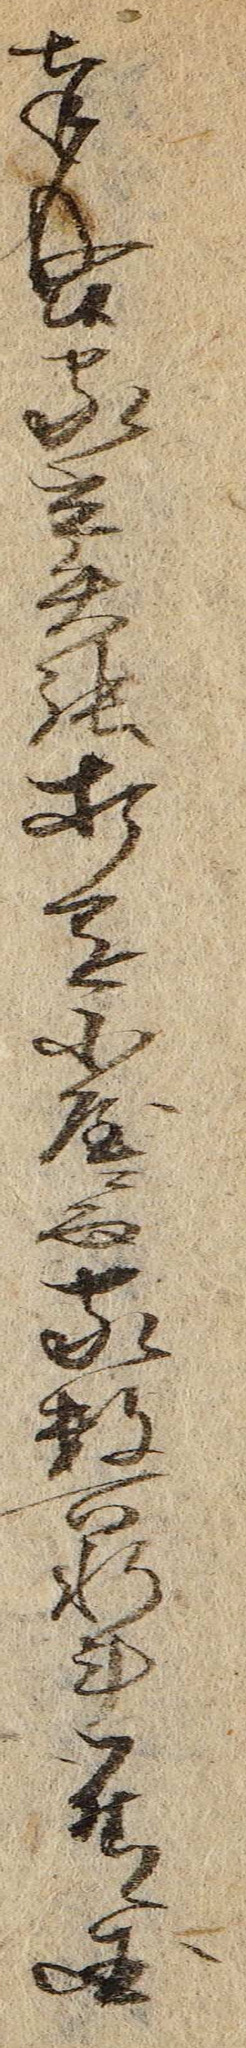奉存候家立矢張打懸小屋にて家数百軒斗御座候国
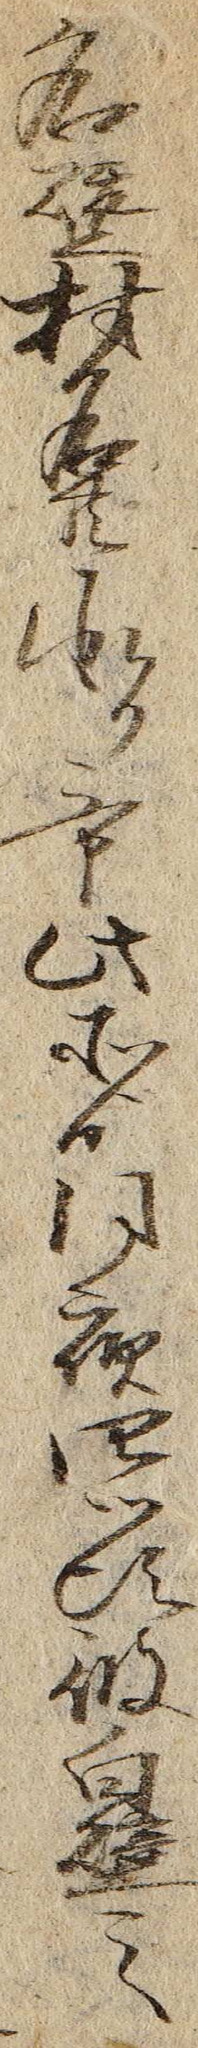名壁材名とも承り不申此所より同夜四つ頃彼白壁の
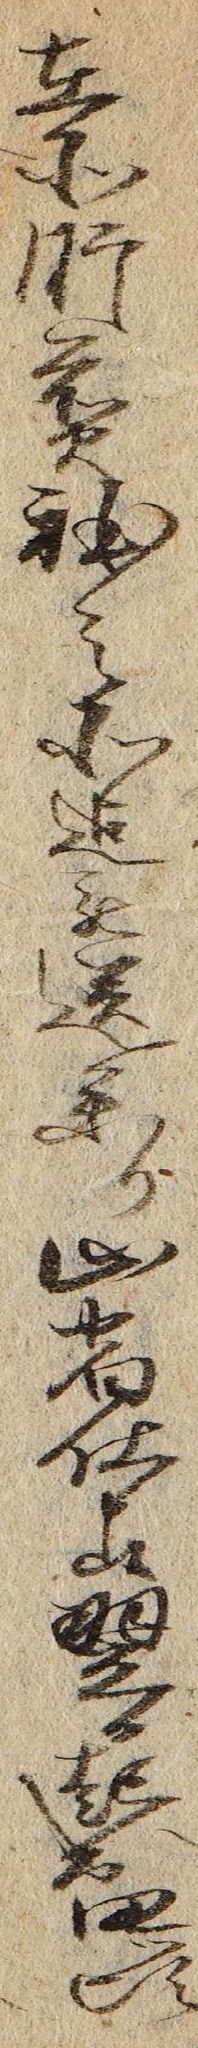在所肝煎体の所まで被送参り止宿申候翌日起出四つ頃
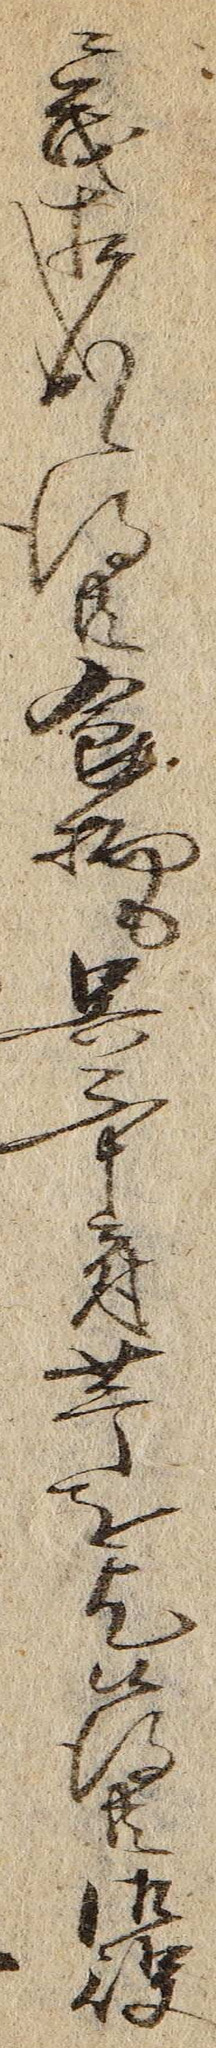にも相成候得ども食物も呉不申に付芋を乞候得ども御役
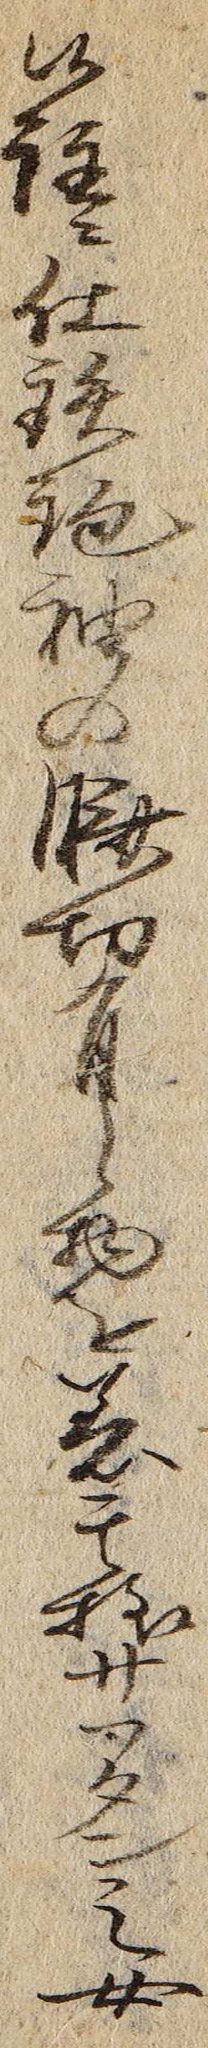候程に仕鉄砲袖の臍切有之物を着其様サフタンの女
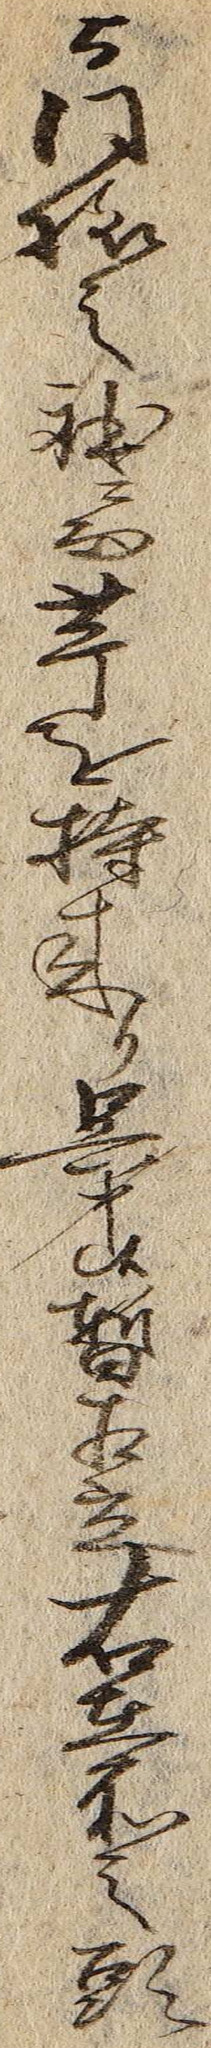と同様の体にて芋を持来り呉申候暫相立右在所の頭
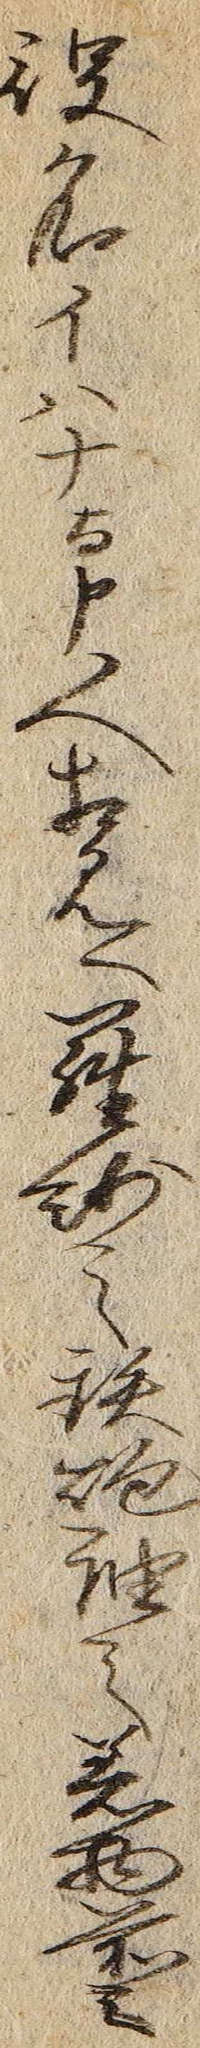役名イハナと申人相見へ羅紗の鉄砲袖の着物前の
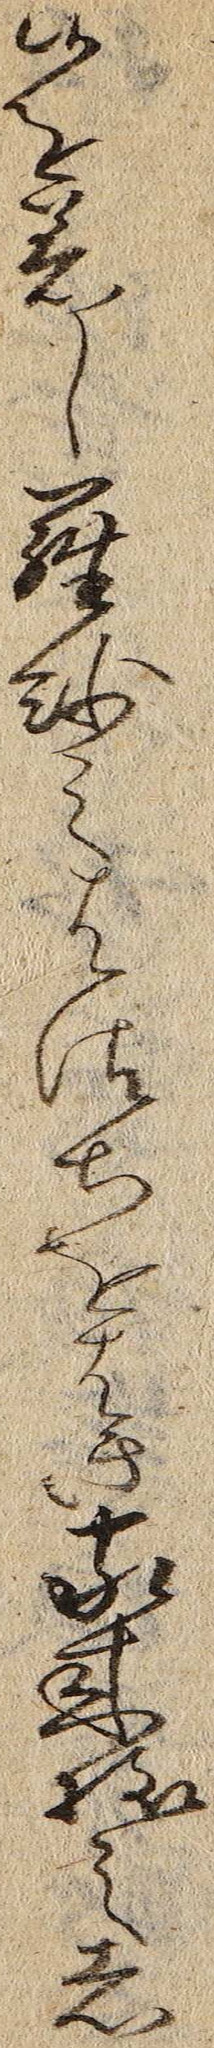候を着し羅紗のはつちをはき家来様の物
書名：能登国清兵衛異国江漂流之始末
